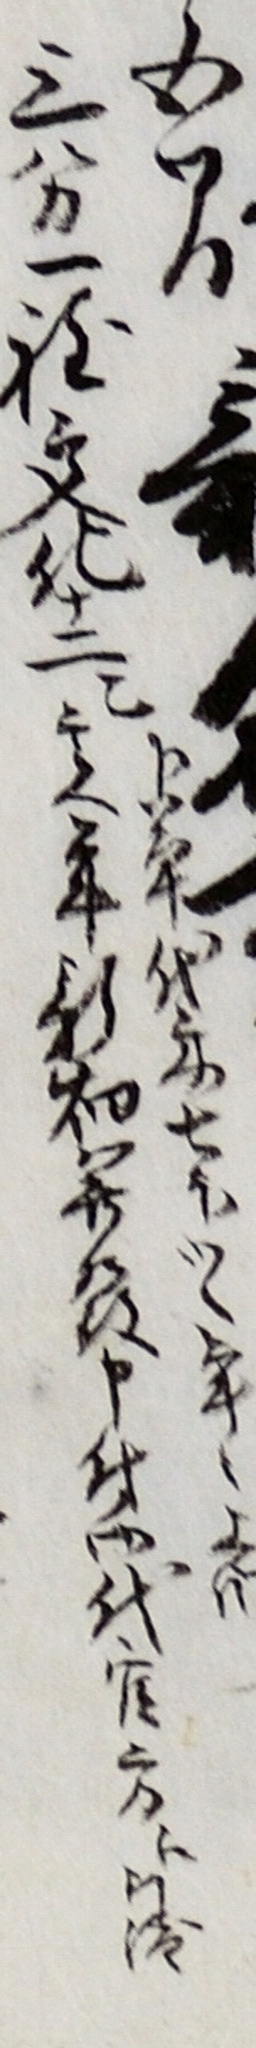三分一程文化十二乙亥年新畑開発申付御代官方え御渡
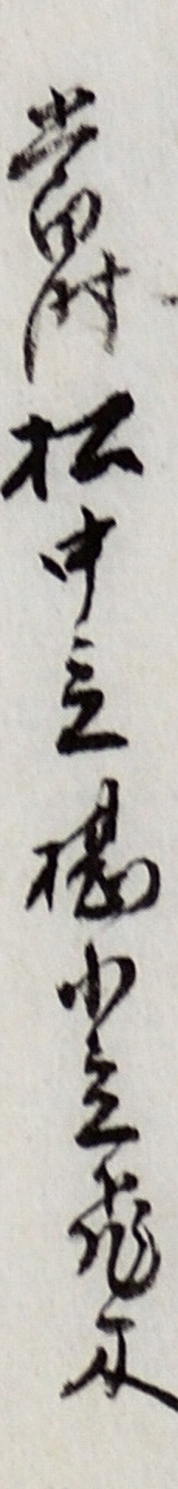当時松中立椹小立飛木
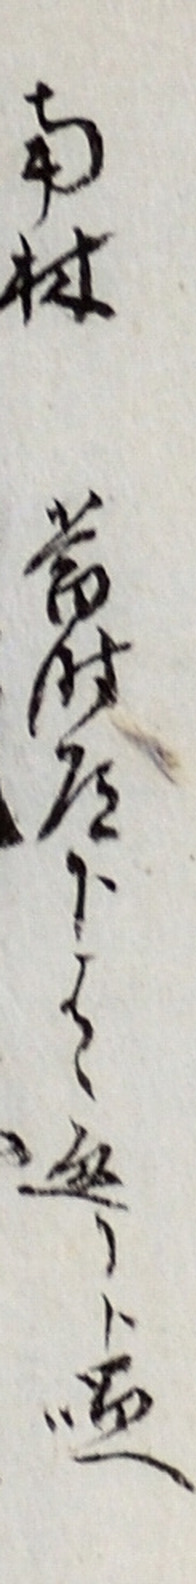南林当時道下はゝ通りト唱へ
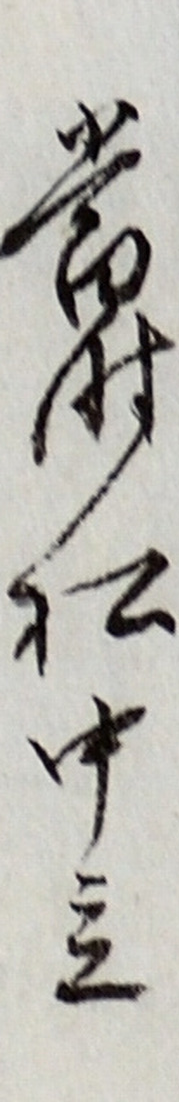当時松中立
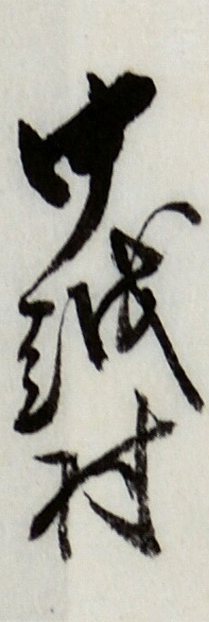中越村
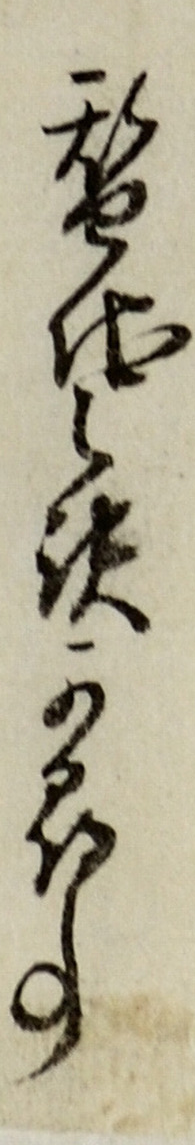替地之訳可尋事
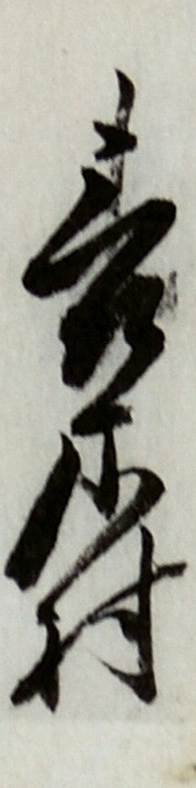表木村
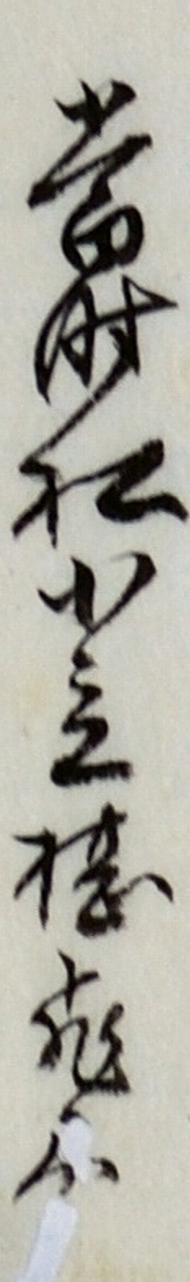当時松小立椹飛木

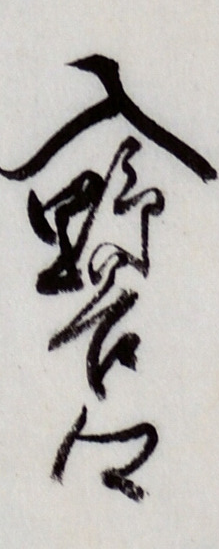入野谷郷
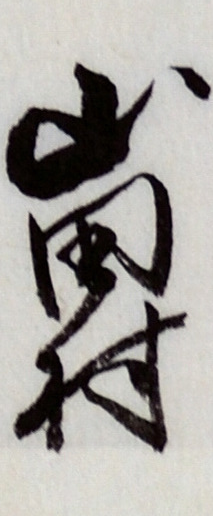山田村
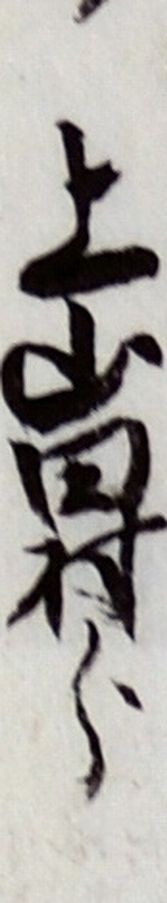上山田村分
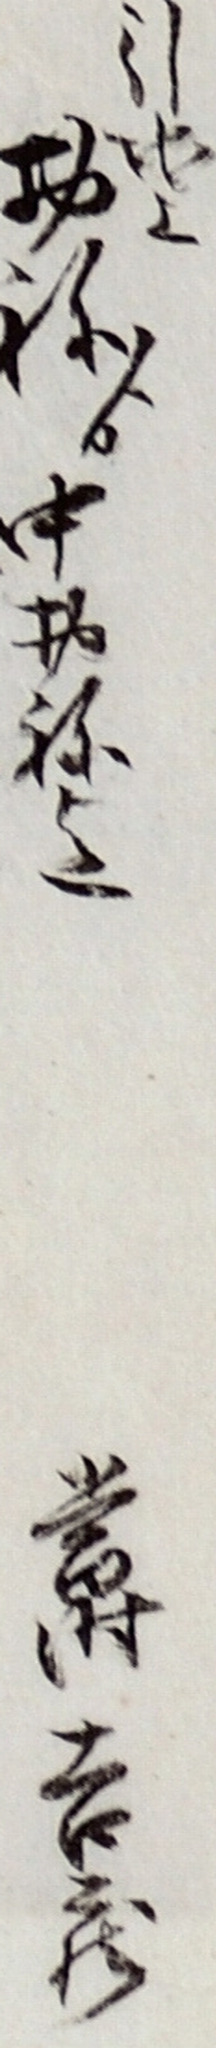おねより中おね迄当時吉蔵
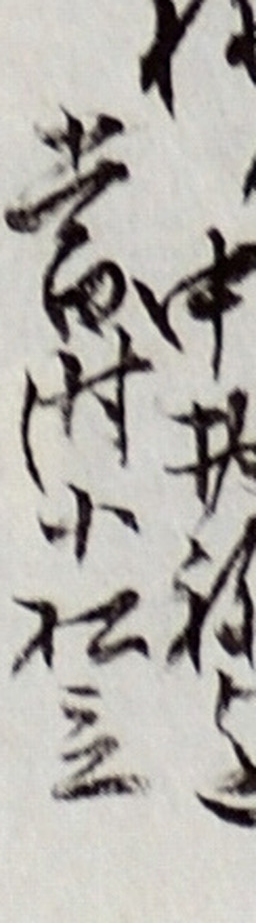当時小松立
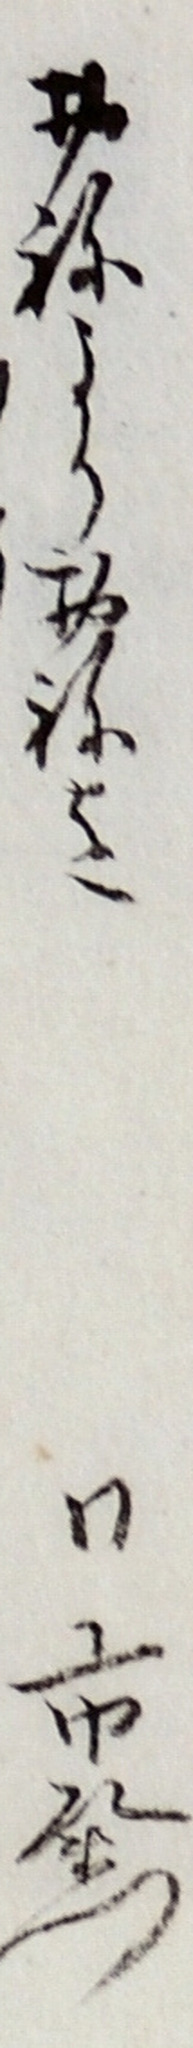おねよりおね迄同市左衛門
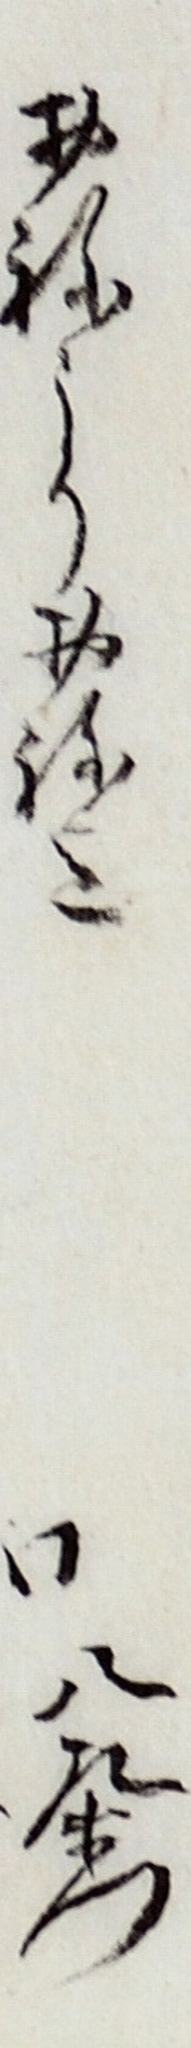おねよりおね迄同八左衛門
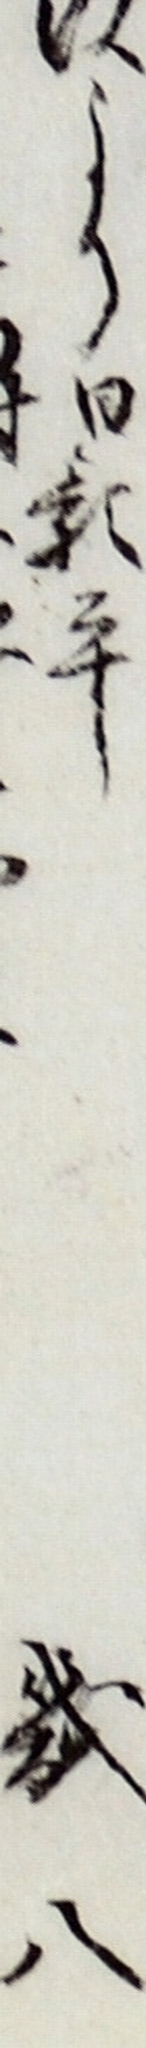沢より日影平幾八
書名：郷中御林御竹薮名所附守之名前帳
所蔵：伊那市立高遠町図書館・合同会社AMANE
